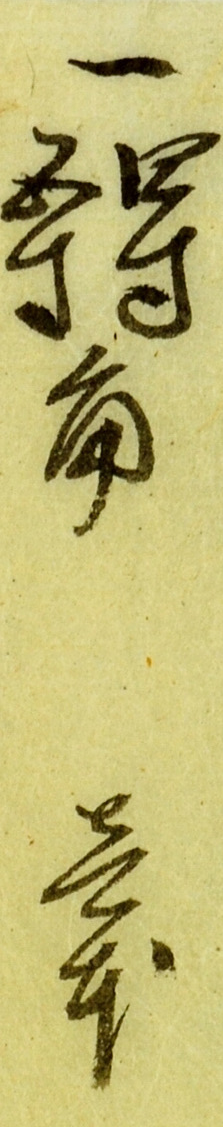一五寸角拾五本
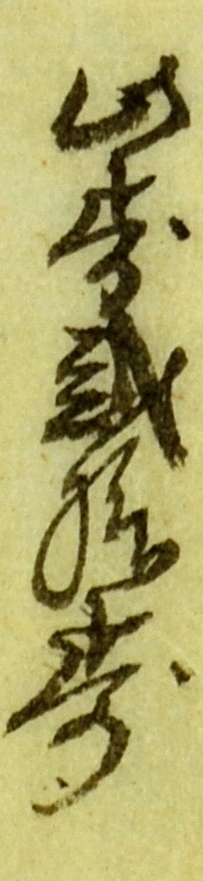此歩弐拾歩
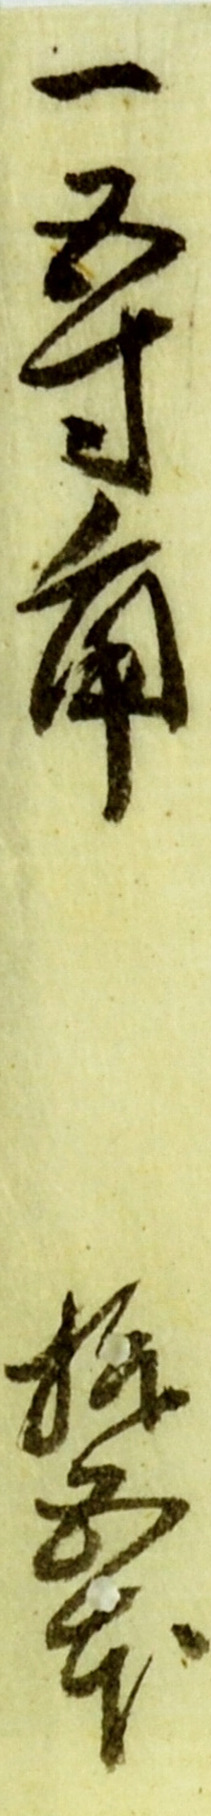一五寸角拾五本
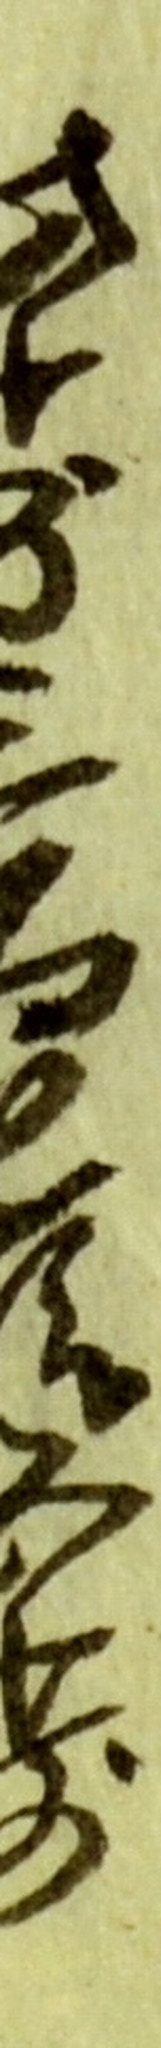此歩三百七拾五歩

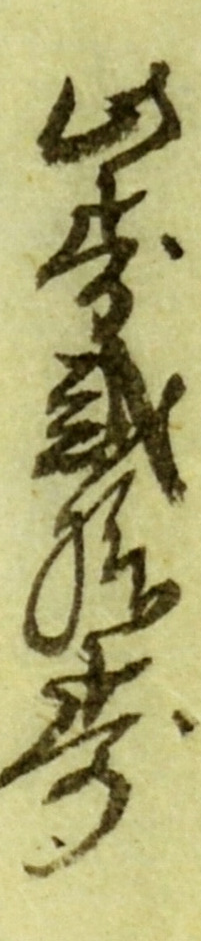此歩弐拾歩
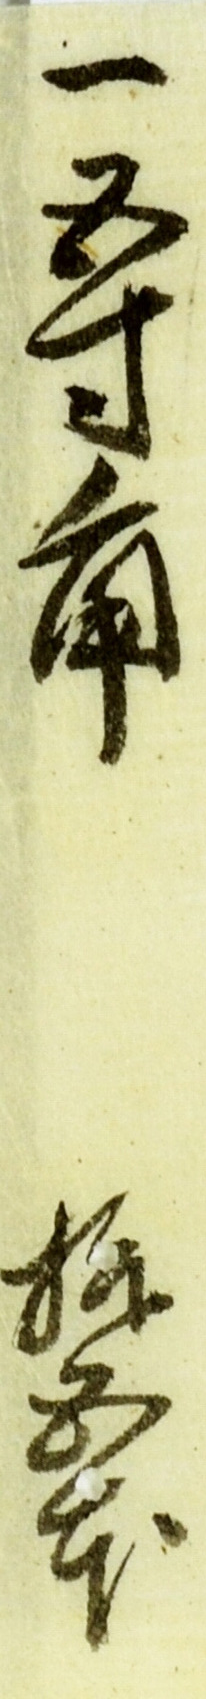一五寸角拾五本
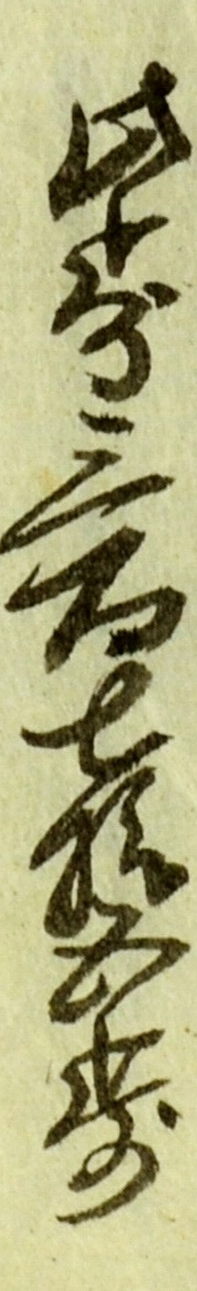此歩三百七拾五歩
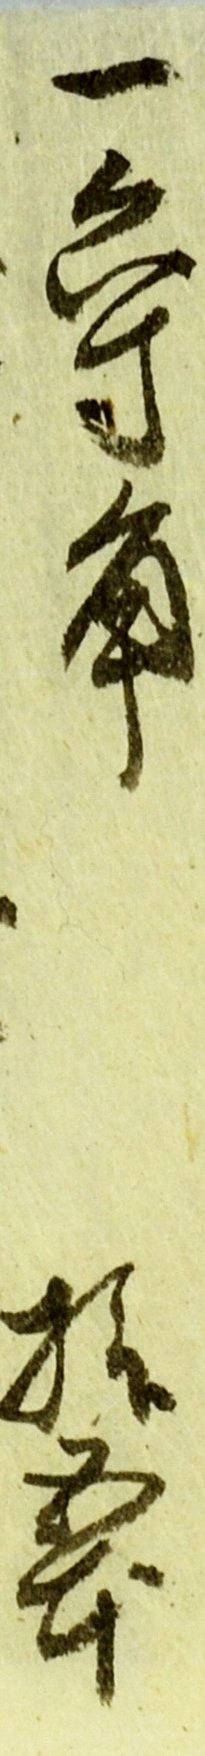一六寸角拾五本
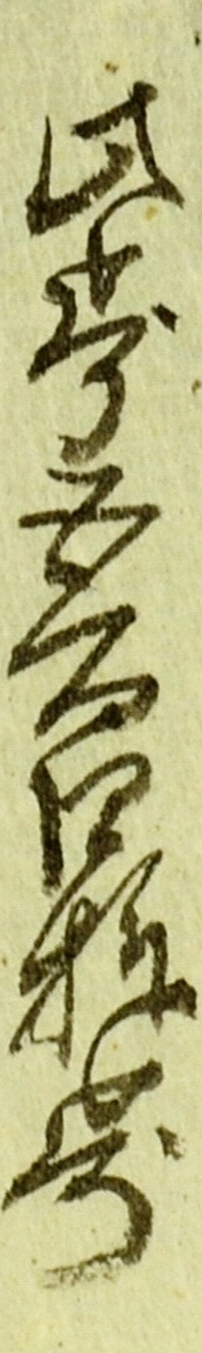此歩五百四拾歩
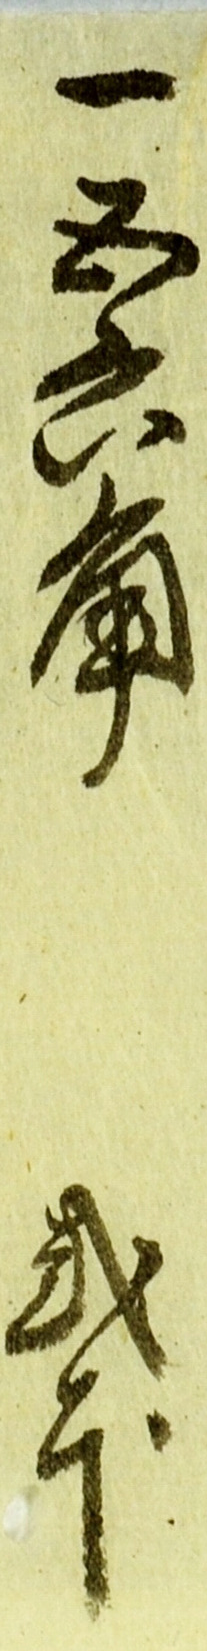一五六角弐本
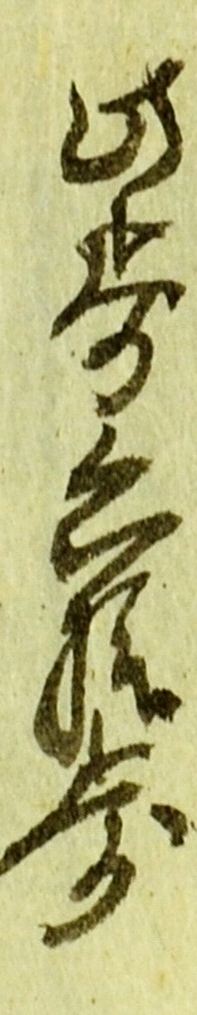此歩六拾歩
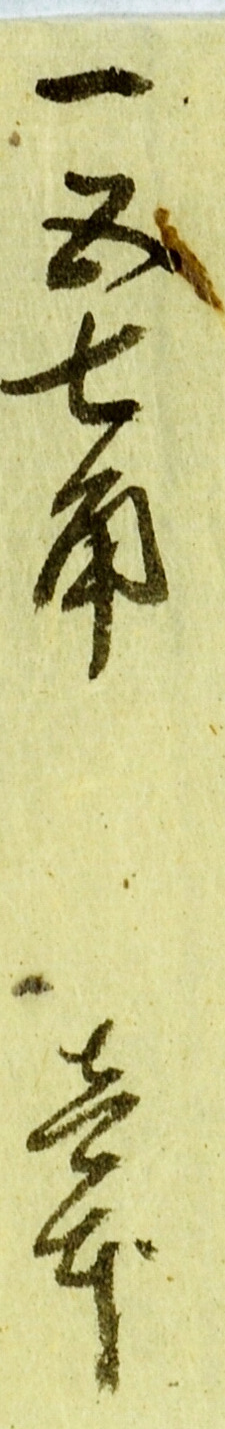一五七角壱本
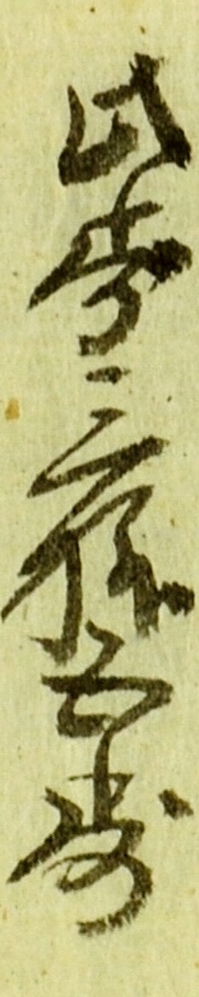此歩三拾五歩
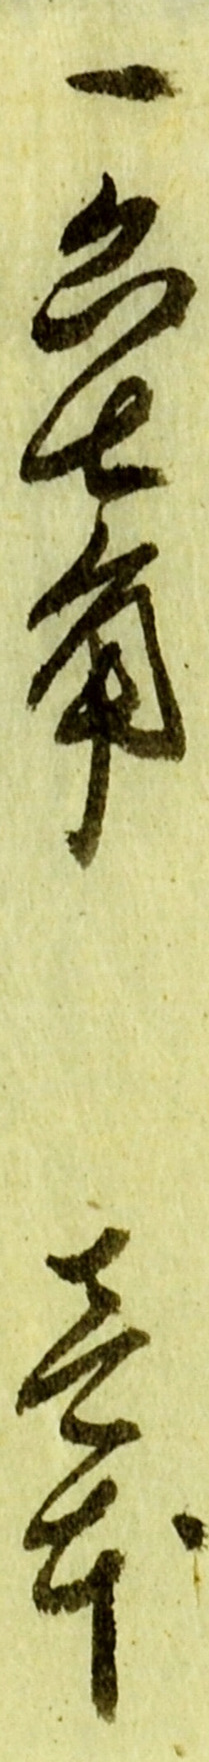一六七角壱本
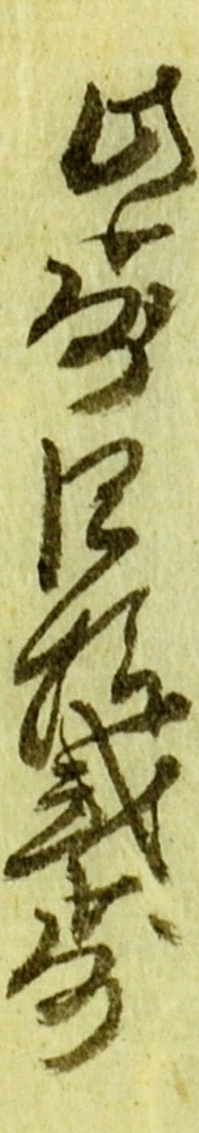此歩四拾弐歩
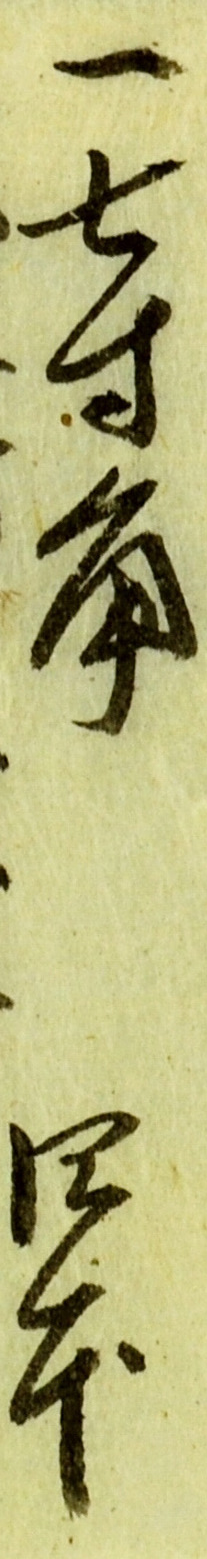一七寸角四本
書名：材木川下ケ分一上納帳
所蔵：伊那市立高遠町図書館・合同会社AMANE
